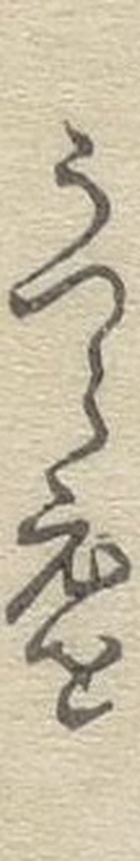うつら衣を
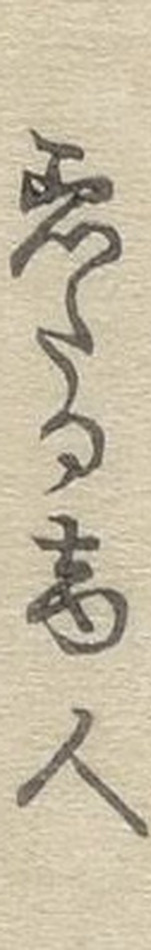着たる商人
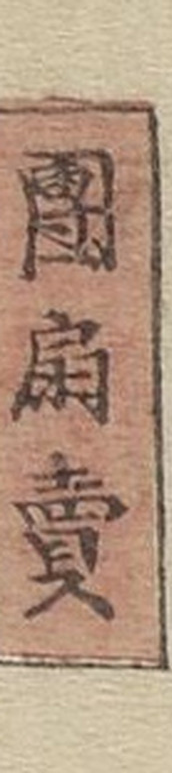団扇売

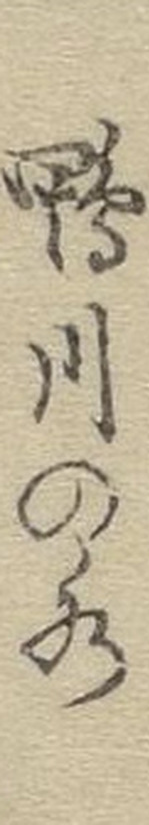鴨川の水
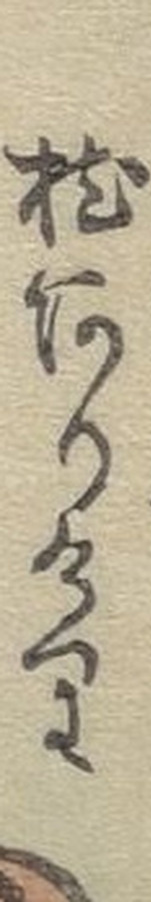枕ありけり
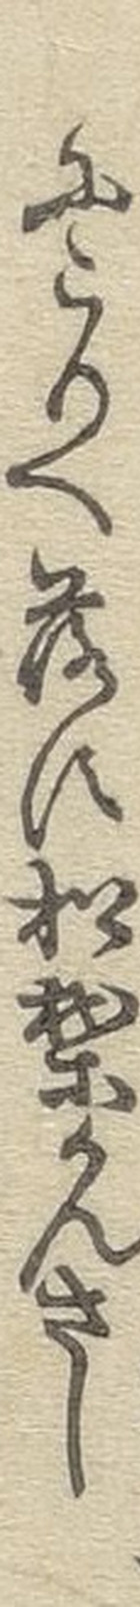にこりへ落す松葉かんさし
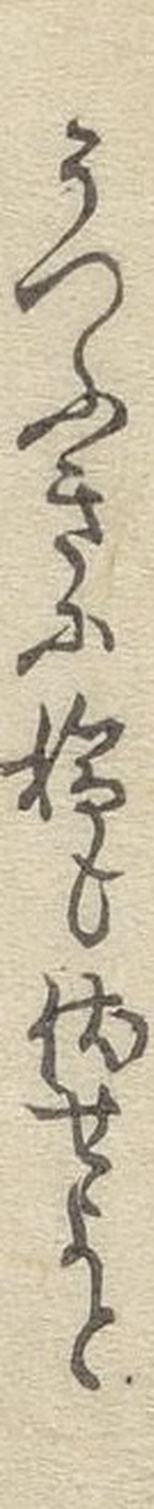うつふきに稲も伏せよと
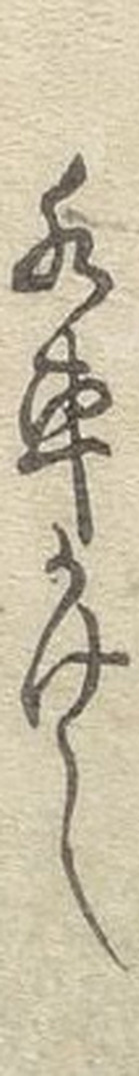水車かけし
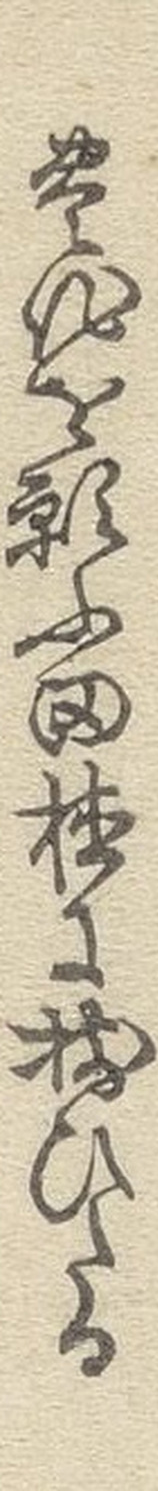豊作を願ふ田植に揃ひたる
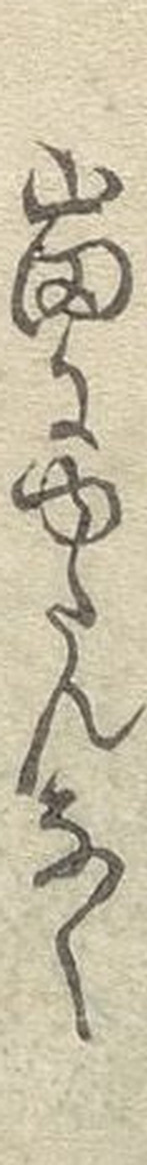山田にゆたんなく
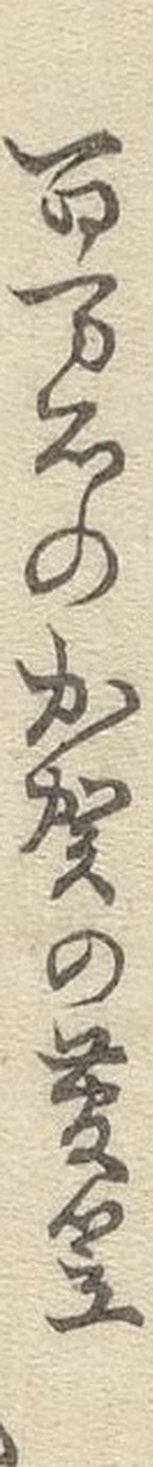百万石の加賀の菅笠
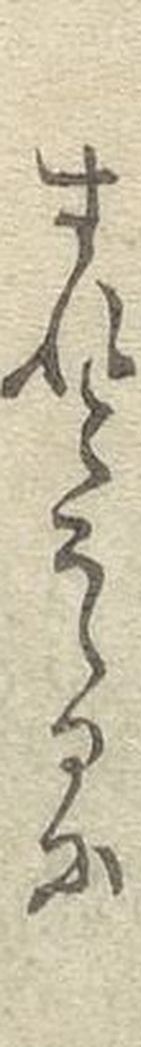すれとうゝるに
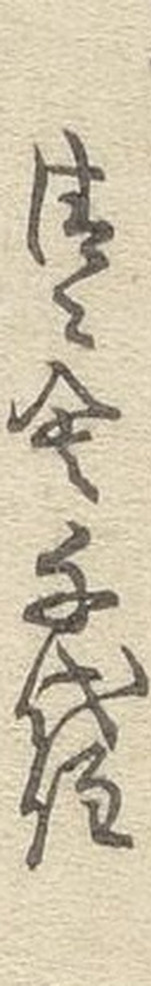清々舎千代住
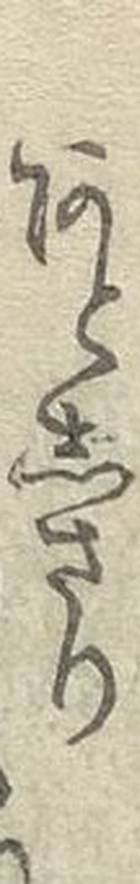あとしさり
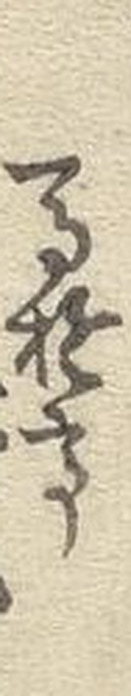東遊亭
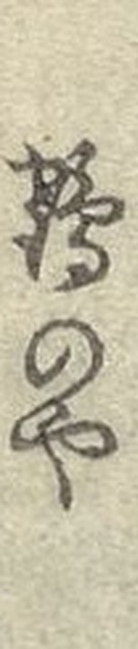鶴のや
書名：Picture Album of People with Kyōka (Light Verse) (Kyōka shiki jinbutsu 狂歌四季人物)
